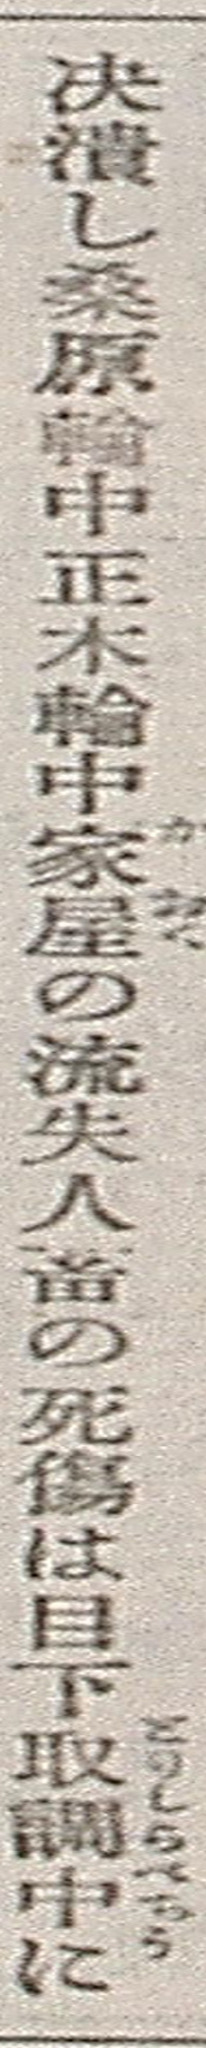决潰し桑原輪中正木輪中家屋の流失人畜の死傷は目下取調中に
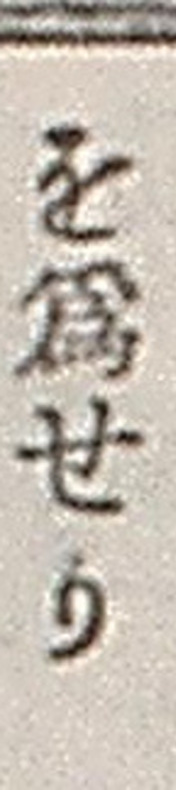を為せり
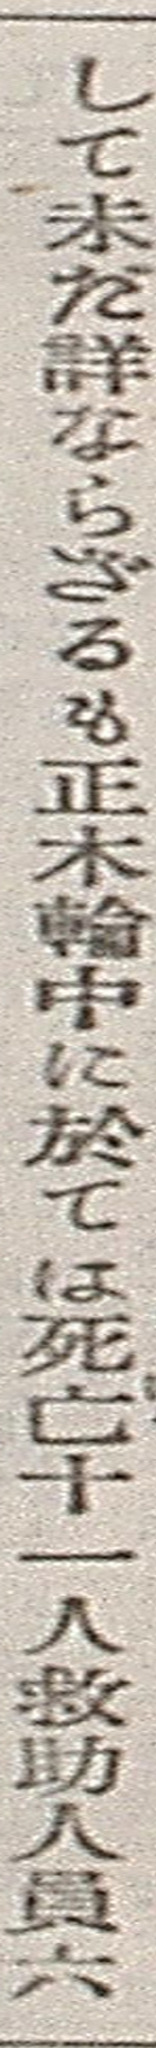して未だ詳ならざるも正木輪中に於ては死亡十一人救助人員六
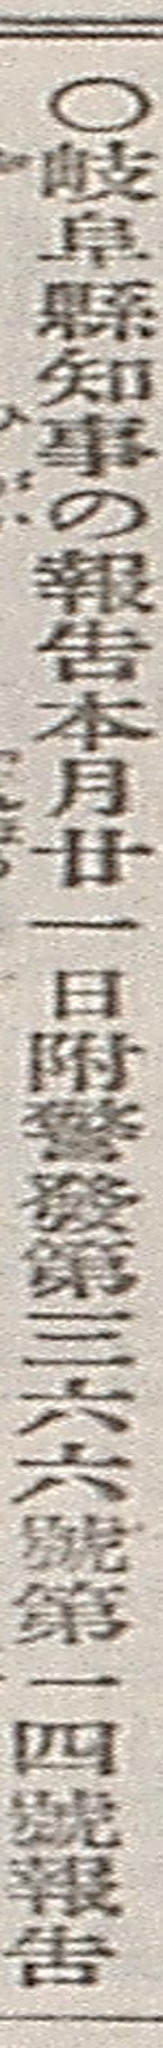◯岐阜県知事の報告本月二十一日附警発第三六六号第一四号報告
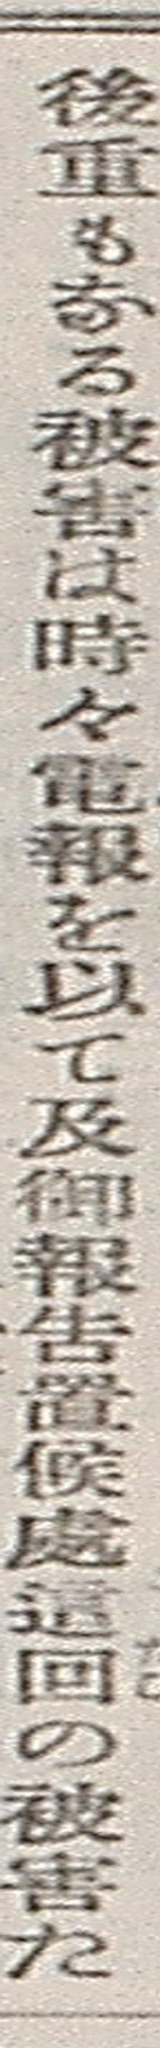後重もなる被害は時々電報を以て及御報告置候処這回の被害た
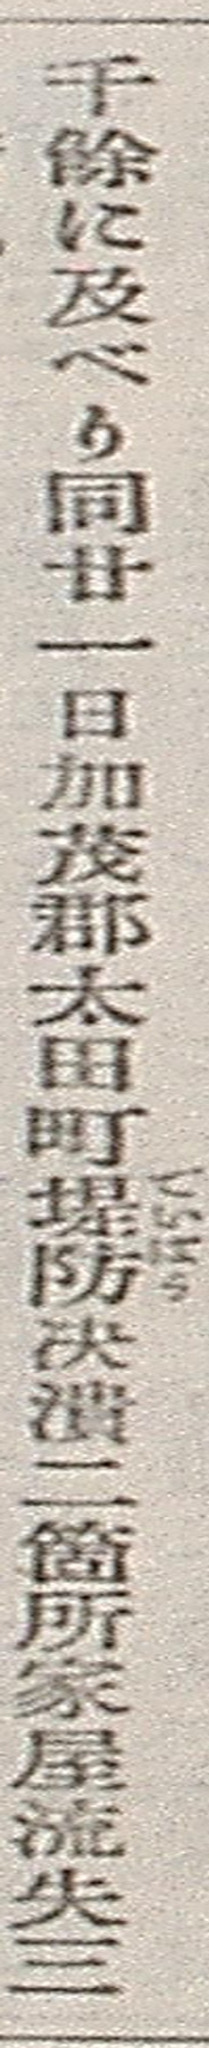千餘に及べり同廿一日加茂郡太田町堤防决潰二箇所家屋流失三
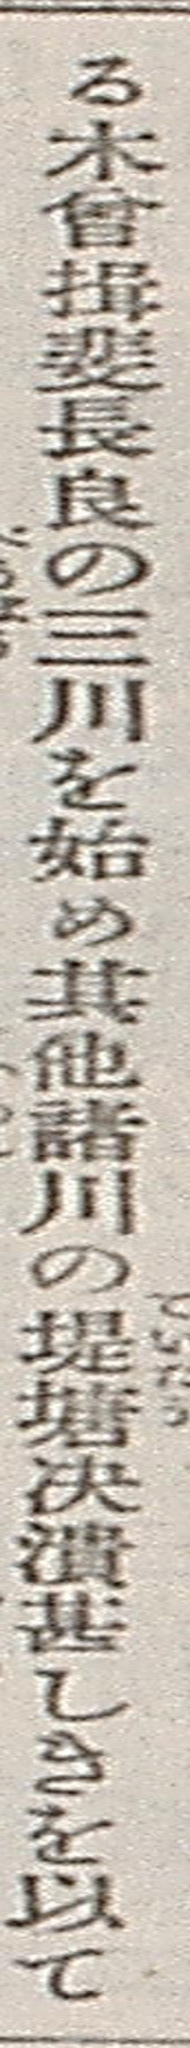る木曽揖斐長良の三川を始め其他諸川の堤塘决潰しきを以て
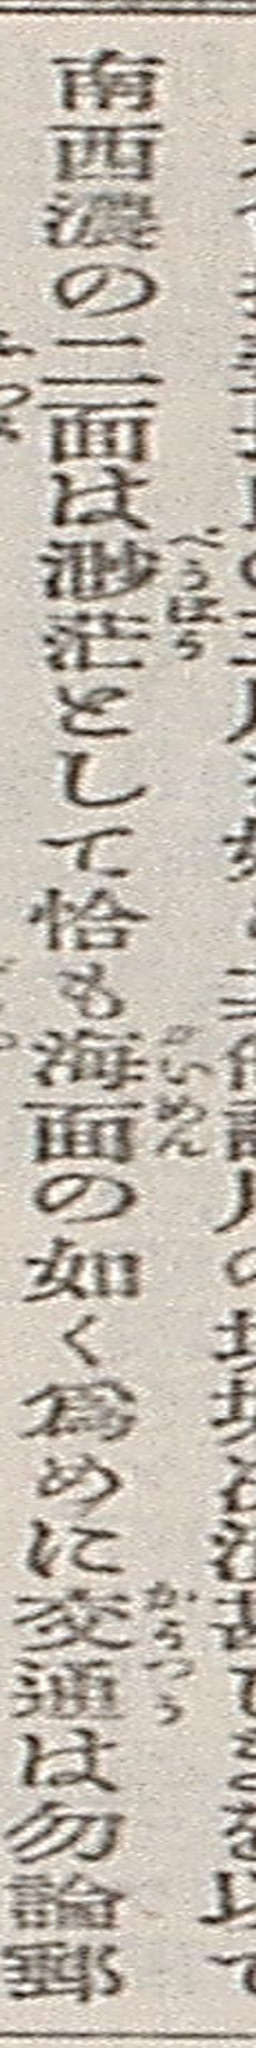南西濃の二面は渺茫として恰も海面の如く為めに交通は勿論郵
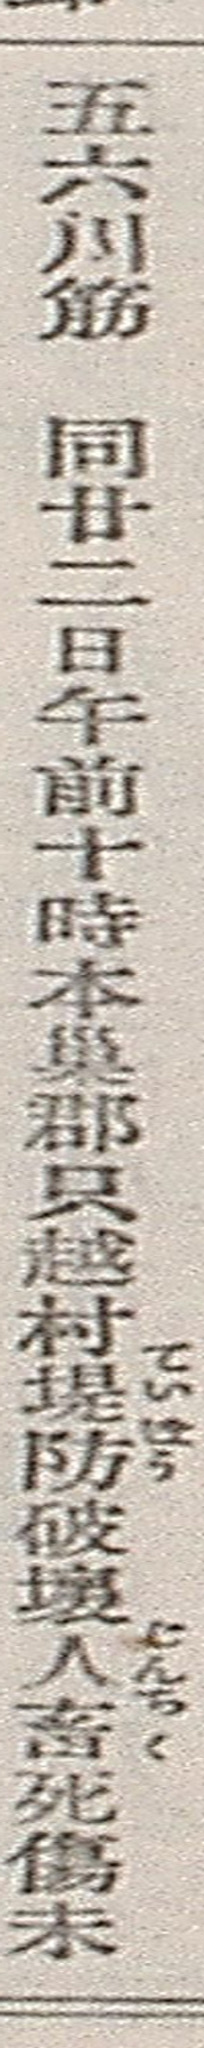五六川筋同廿二日午前十時本巣郡只越村堤防破壊人畜死傷未
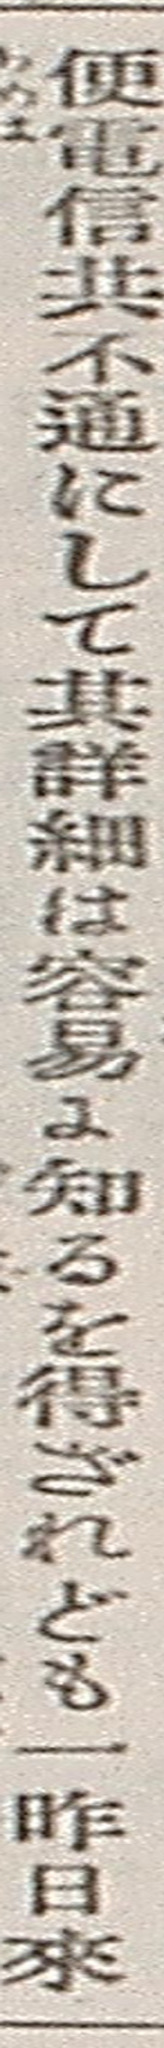便電信共不通にして其詳細は容易に知るを得ざれども一昨日来
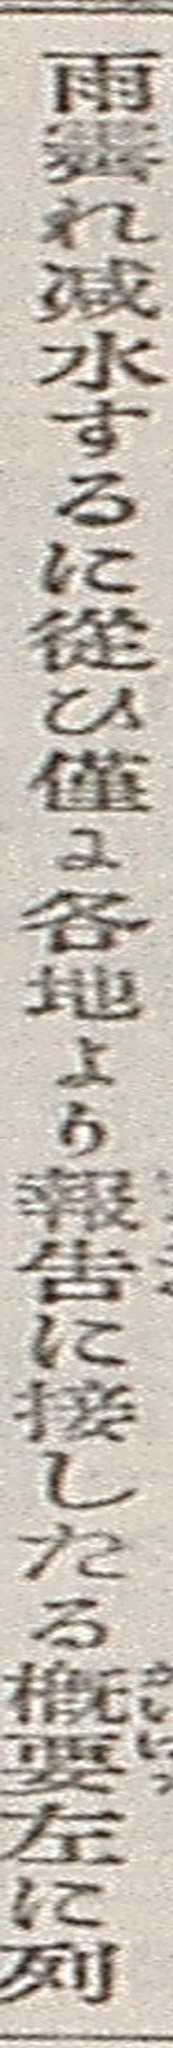雨霽れ減水】するに従ひ僅に各地より報告に接したる概要左に列
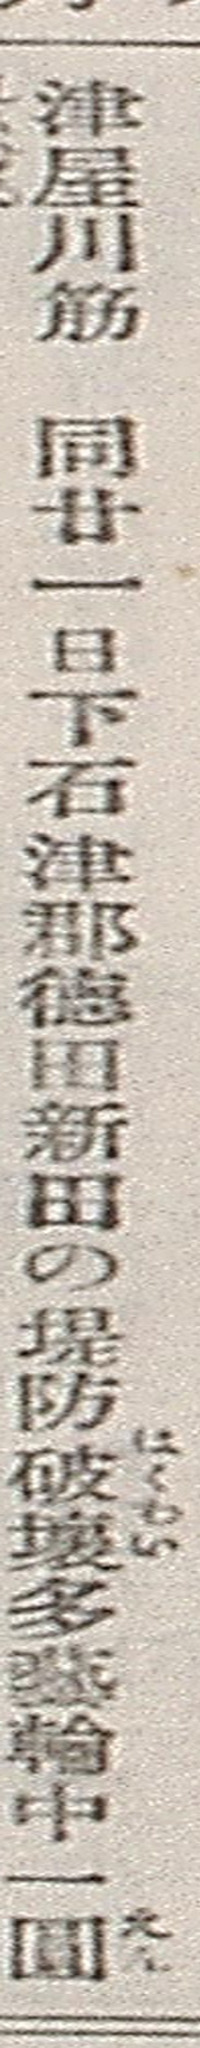津屋川筋同廿一日下石津郡徳田新田の堤防破壊多芸輪中一円
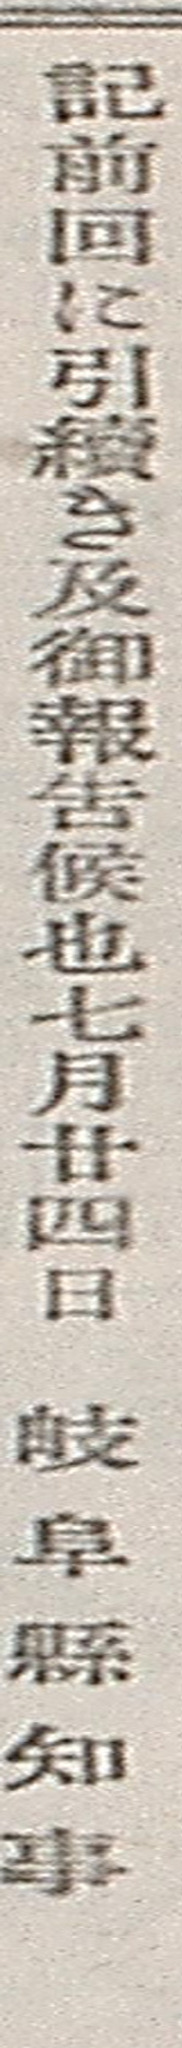記前回に引続き及御報告候也七月廿四日岐阜県縣知事
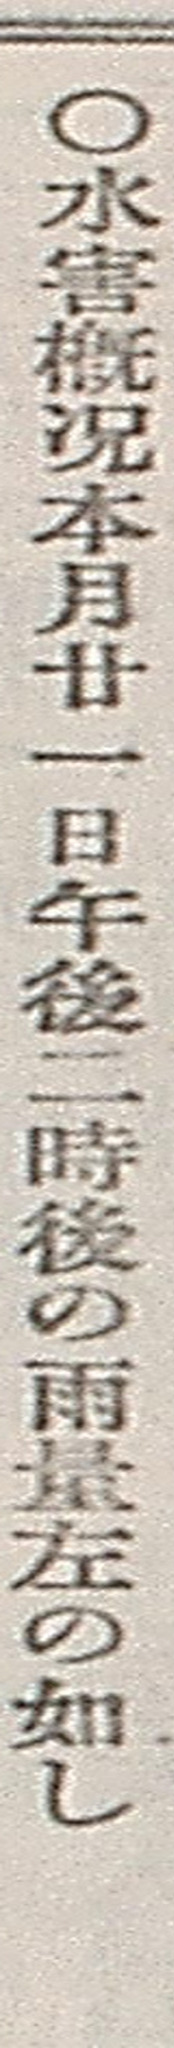◯水害概況本月廿一日午後二時後の雨量左の如し
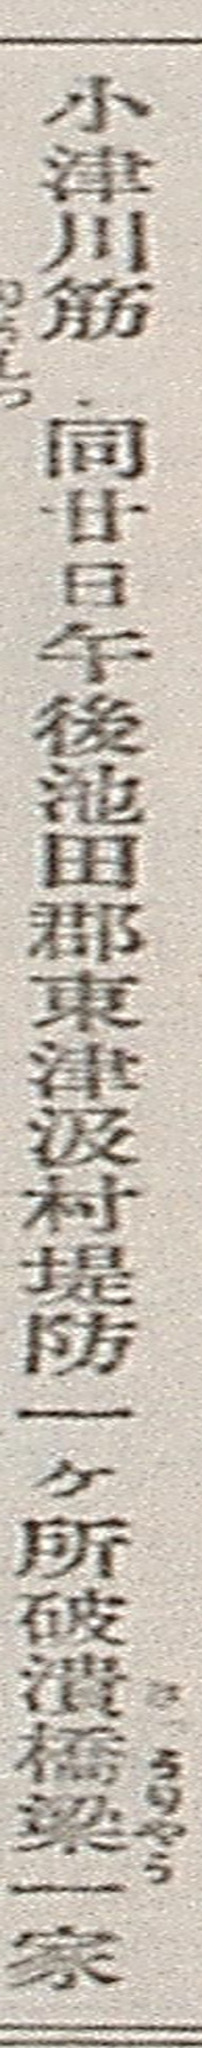小津川筋同廿日午後池田郡東津汲村堤防一ヶ所破潰橋梁一家
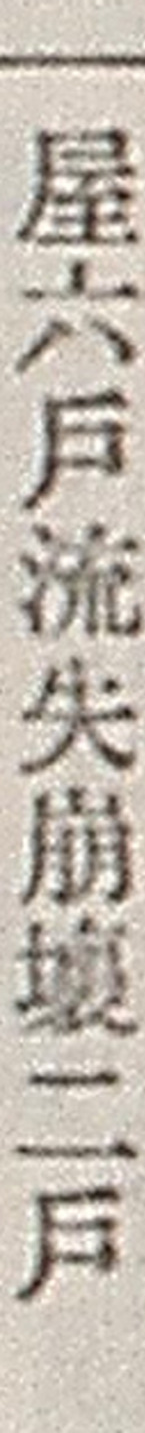屋六戸流失崩壊二戸
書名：風俗畫報臨時増刊第百二十六號　洪水被害録（中）
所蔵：東京大学地震研究所図書室 Earthquake Research Institute Library, The University of Tokyo, JAPAN
